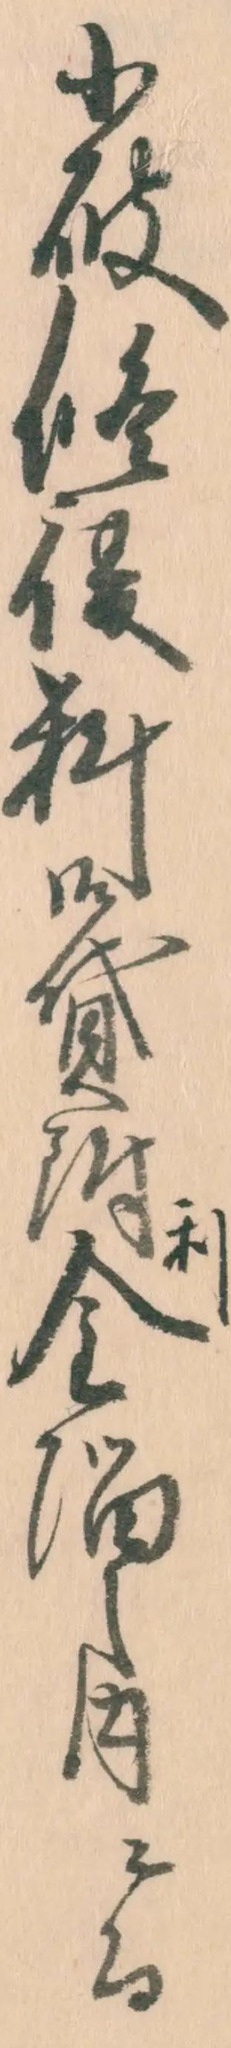小破修復料御貸附利金溜之内に而
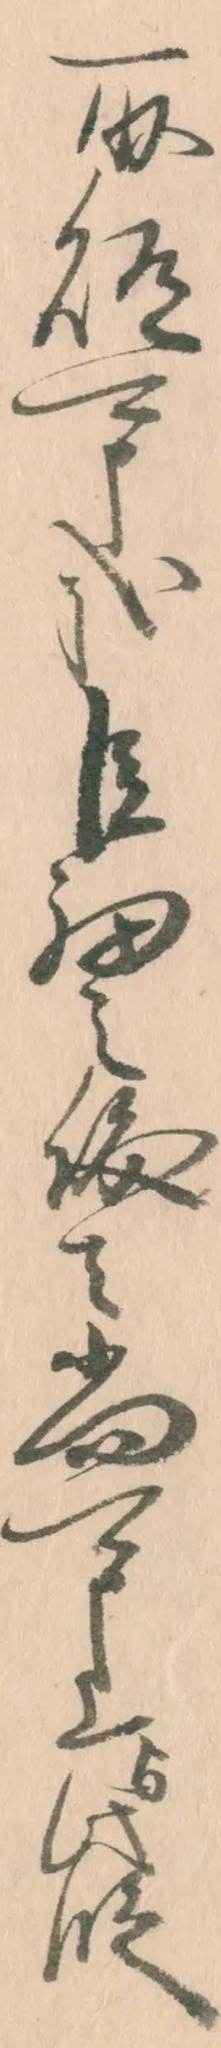取賄可申哉巨細之儀は尚可申上と此段
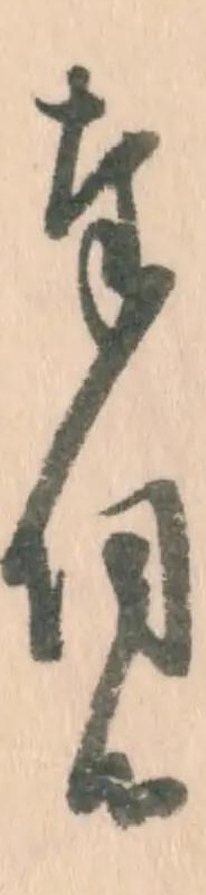奉伺候

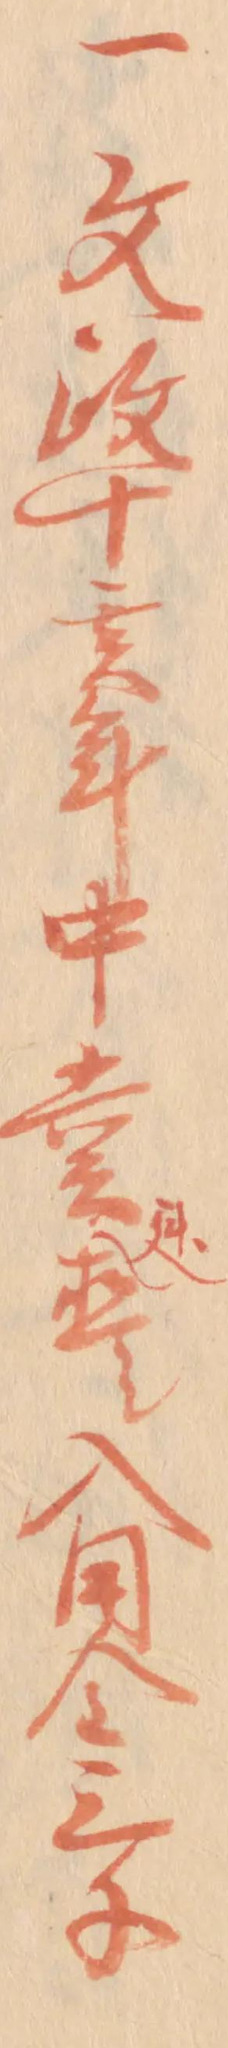一文政十亥年中堂建直し入用金三千
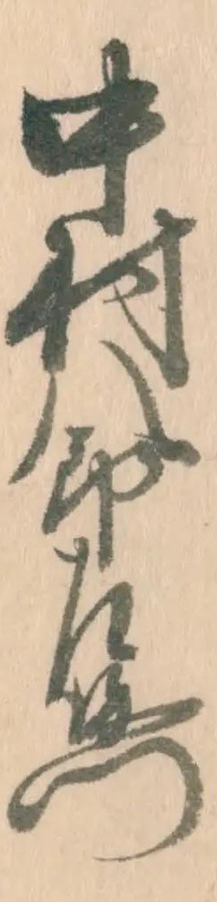中村八郎左衛門

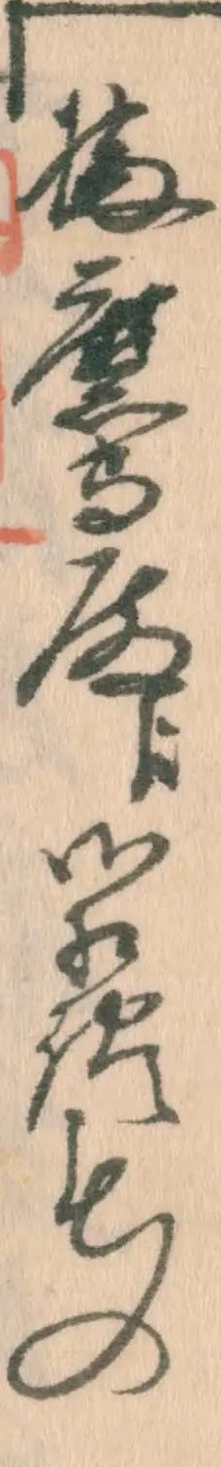播磨守殿え御相談もの
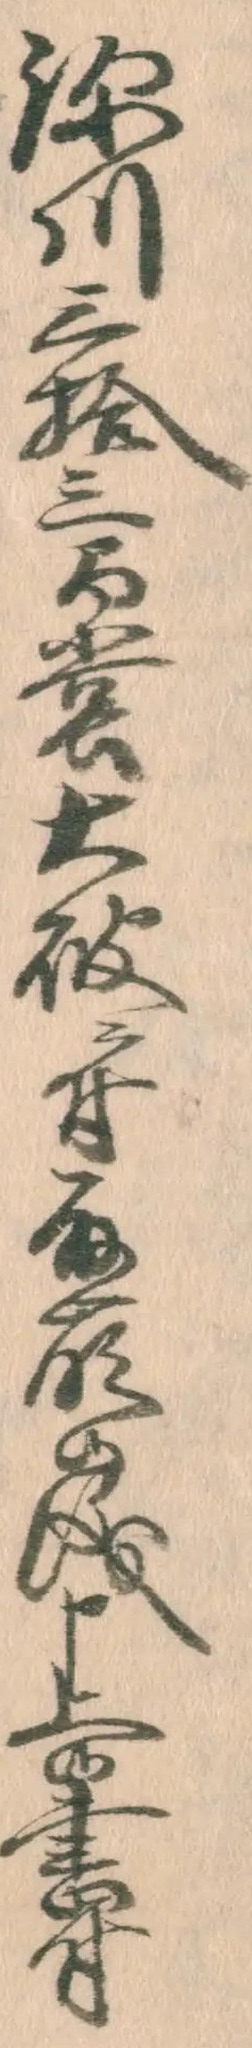│深川三拾三間堂大破に付取崩候儀申上候書付
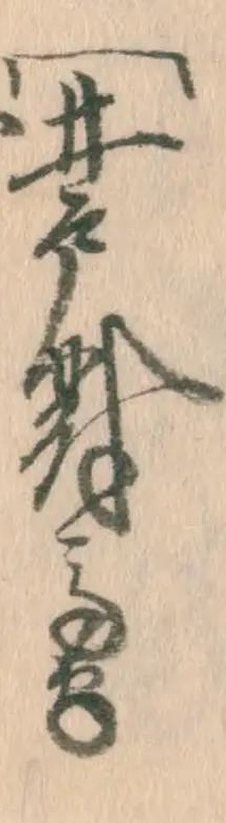│井戸対馬守
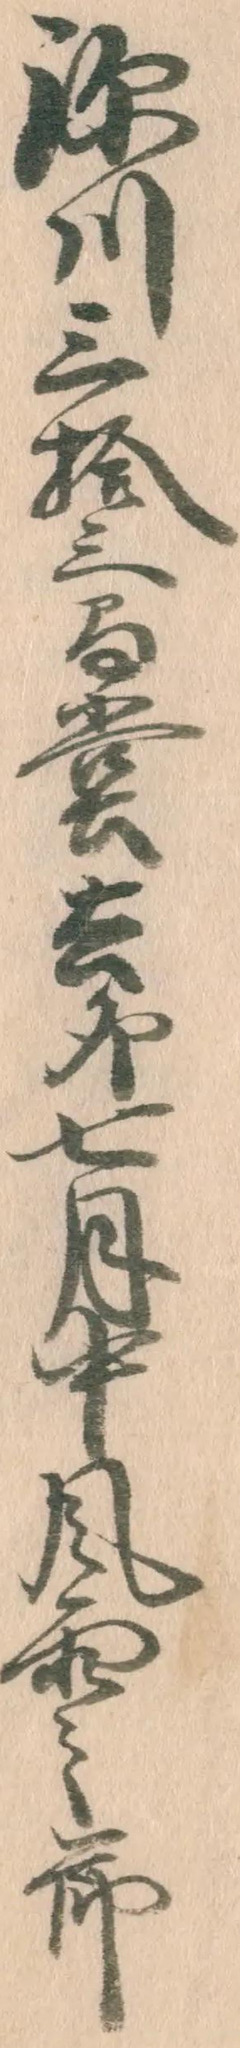深川三拾三間堂去卯七月中風雨之節
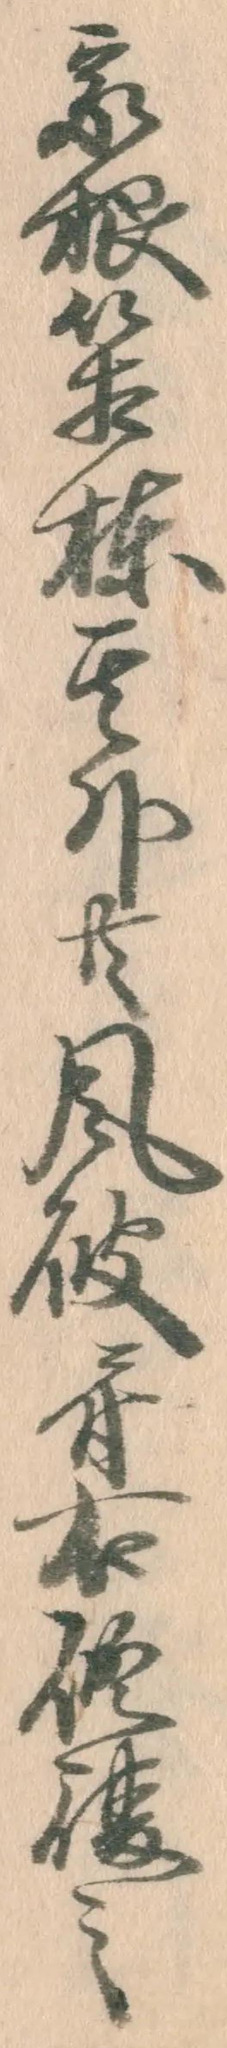家根箱棟其外共風破に付右修復之

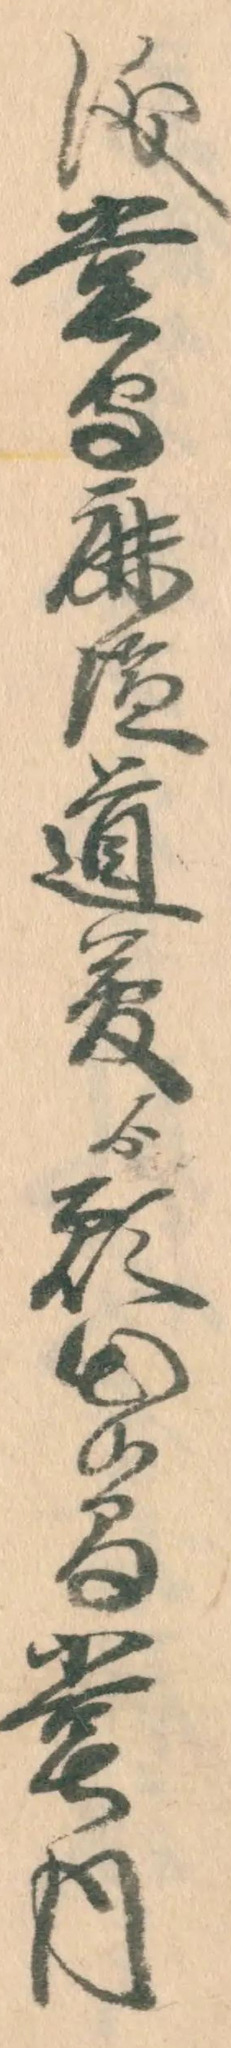儀堂守鹿塩道菅ゟ願出候間堂内
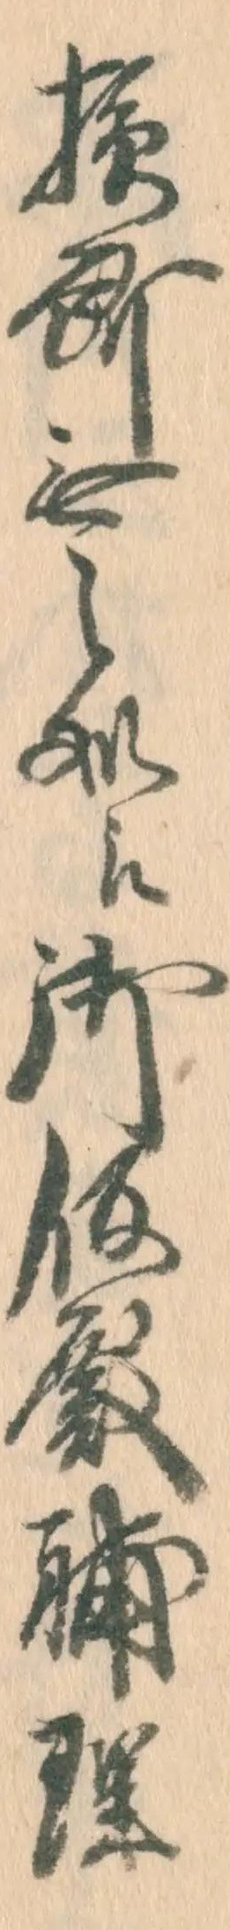損所無之処え御仮殿補理
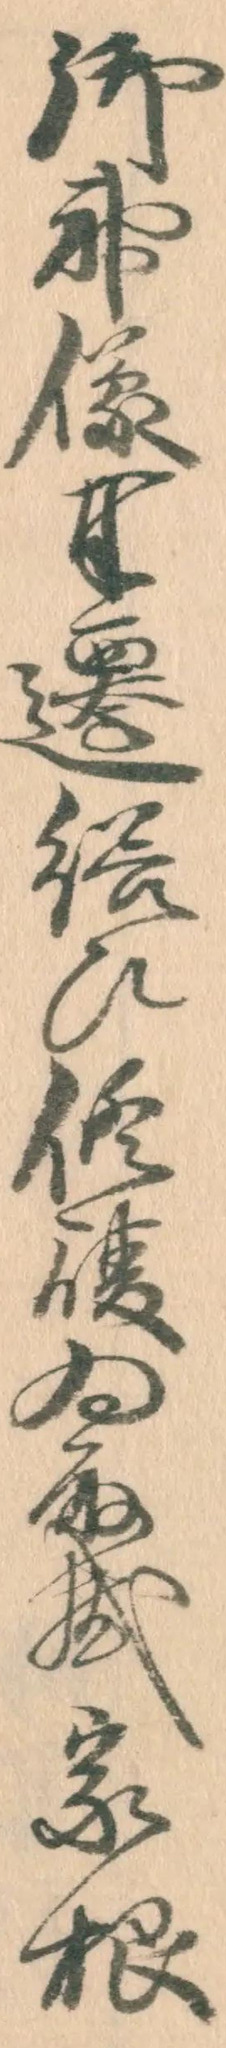御神像奉遷繕ひ修復為取掛家根
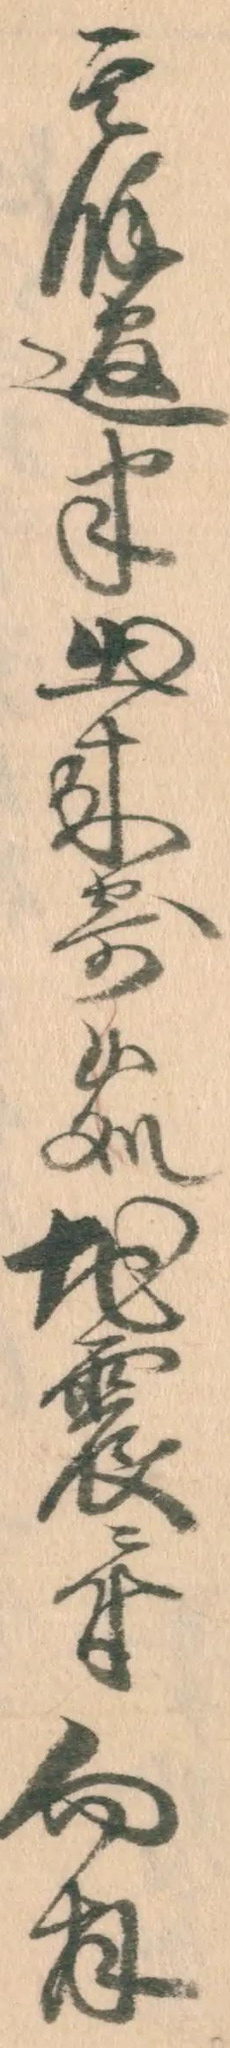其余過半出来寄候処地震に付向拝
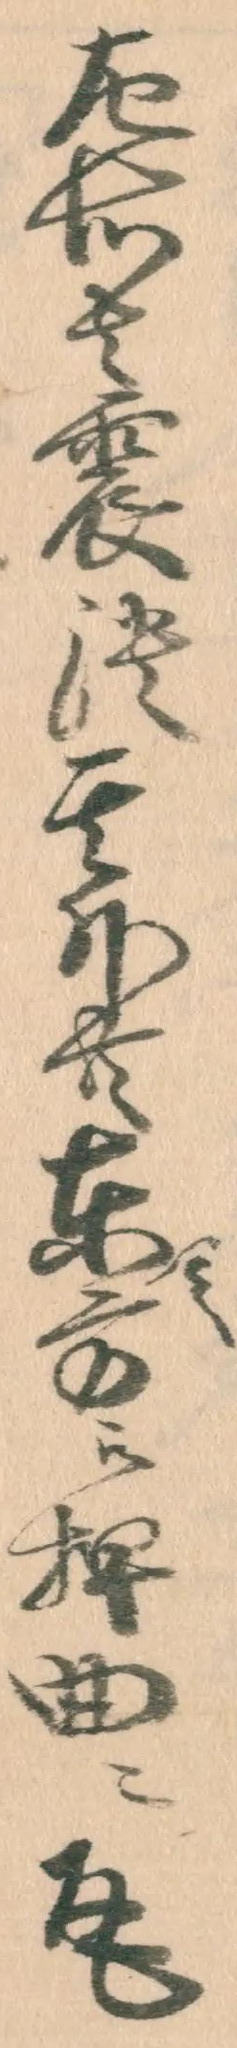左右は震潰其外共東之方え押曲に瓦
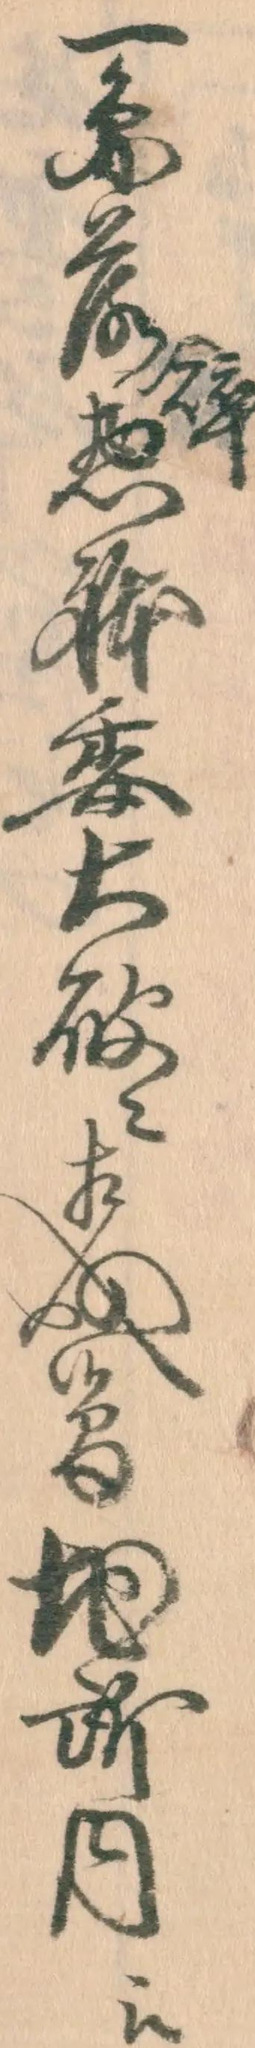一円落砕惣体委大破に相成候間地所内え
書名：三十三間堂. [1]
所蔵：国立国会図書館 National Diet Library, JAPAN
